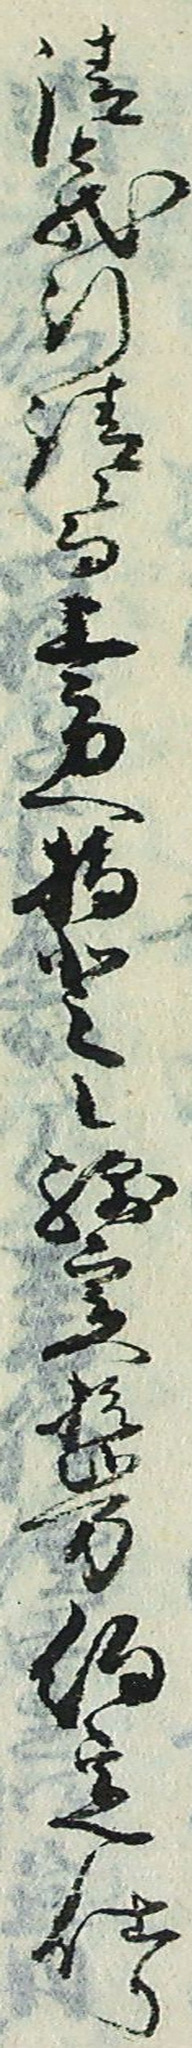清蔵引請に而上方へ指登之綿実拾弐万約定仕り
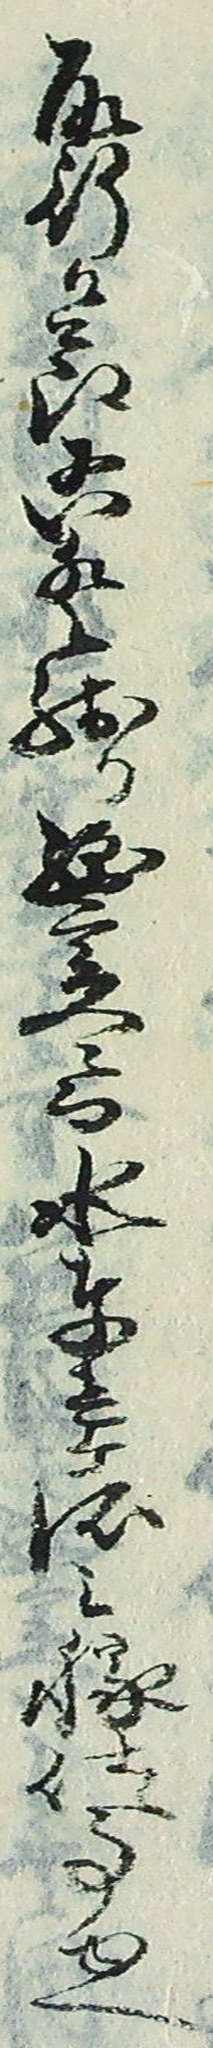取行候節右登残り綿実に而水車壱ケ所之稼仕候事ゆへ
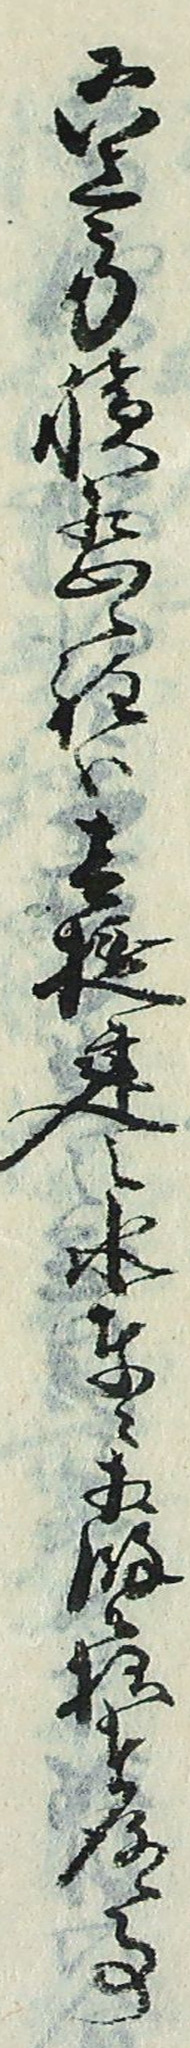右上方積整候程は壱梃建之水車に相余候様奉存候事
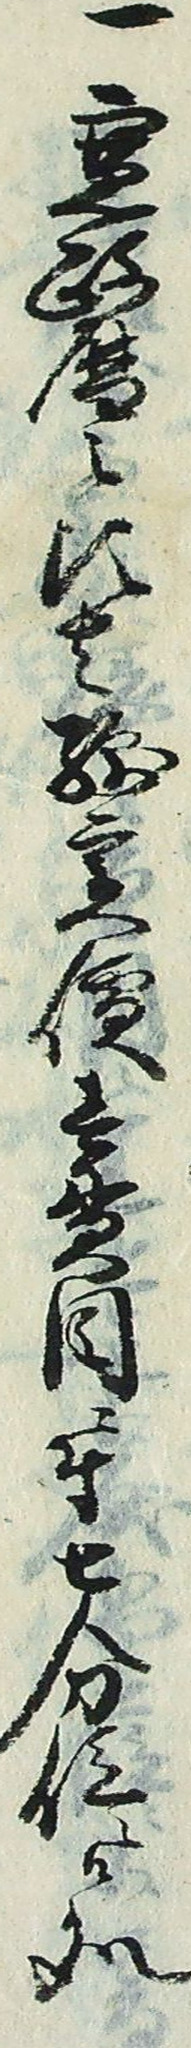一寬政暦之比者綿実価壱貫目に付七分位に候処
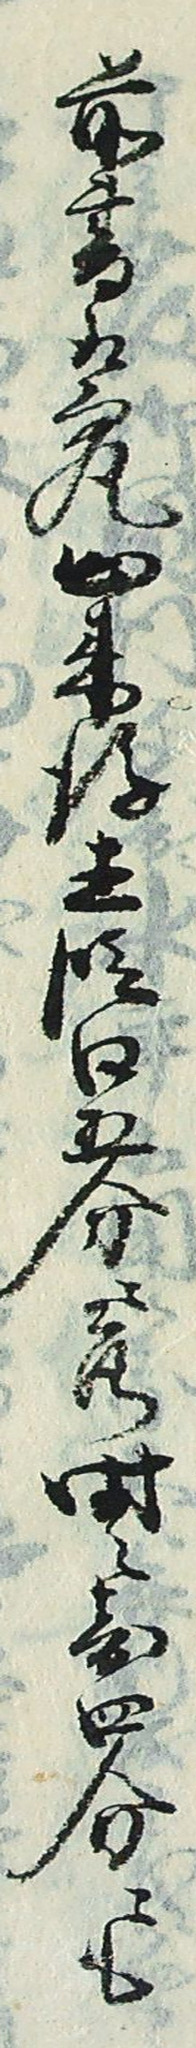前書取究出来後直段同五分に落時に寄四分にも
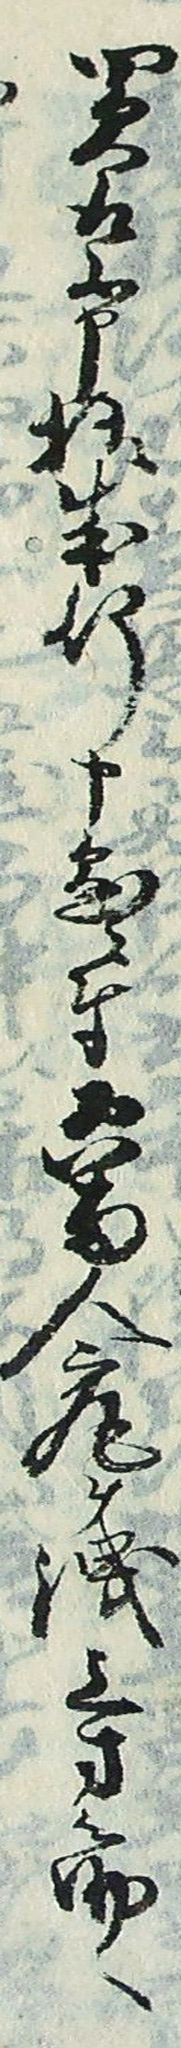買取不申様成行申懸に付右商人究を洩上方筋へ
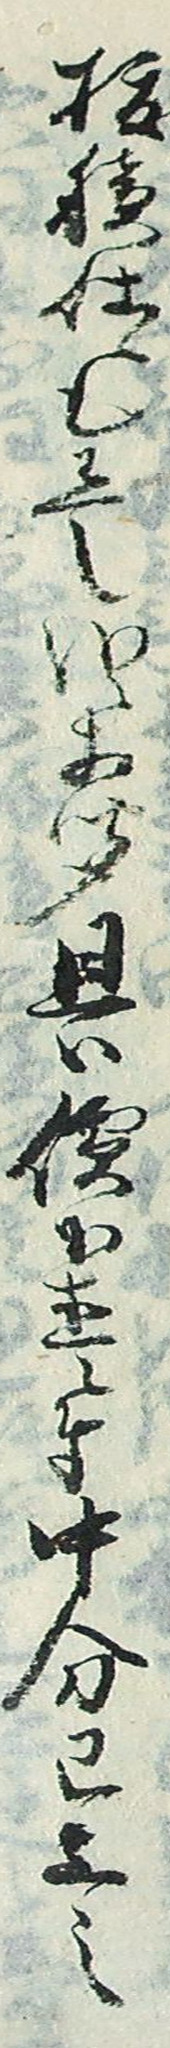抜積仕候も有之哉に相聞且は価下直に付中分已上之

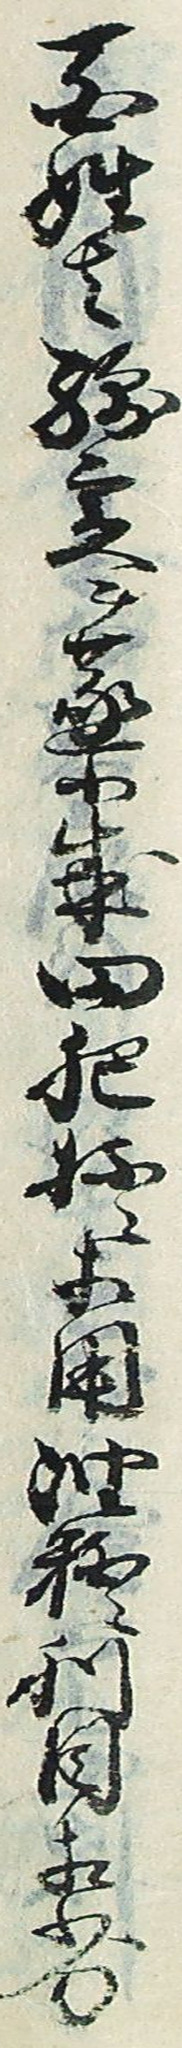百姓者綿実を蒸小成田肥に相用油粕に利目相劣
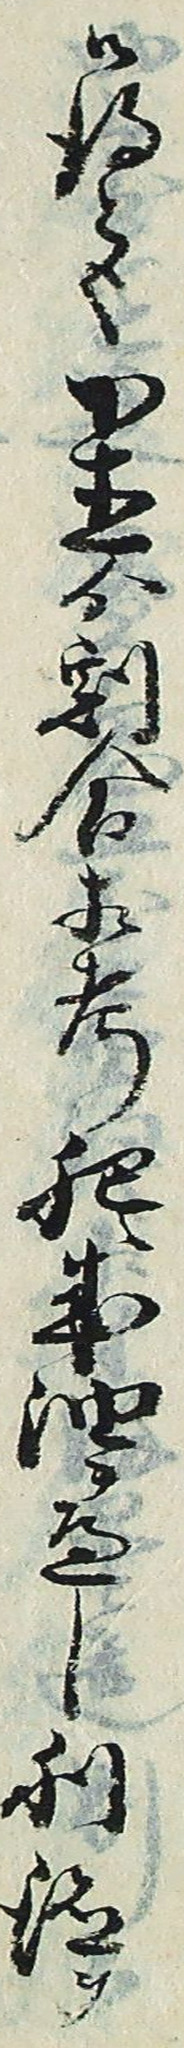候得とも下直ゟ割合相考肥に成油をへし利徳を
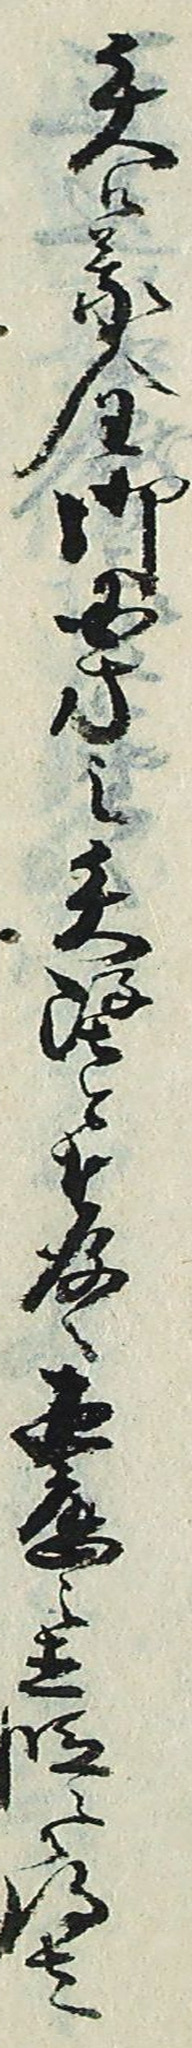失候義全御国方之失墜と奉存候相応の直段に候得者
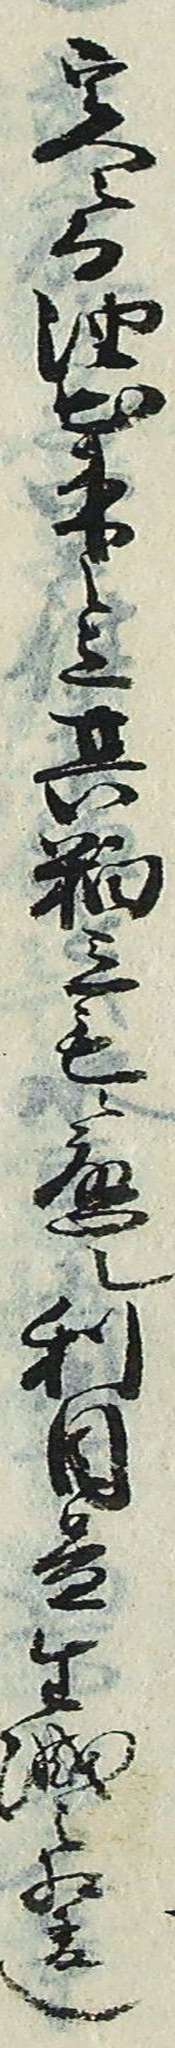実に而油出来之上其粕立毛に応し利目益生滅之相違
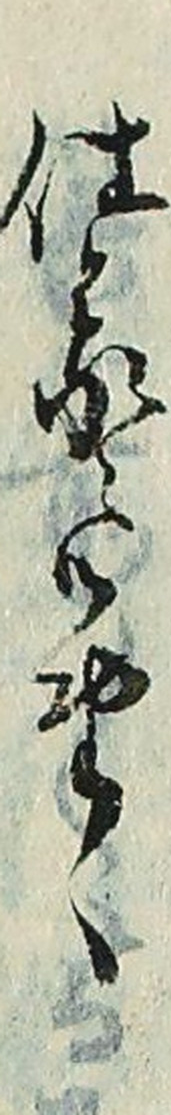仕義に御坐候
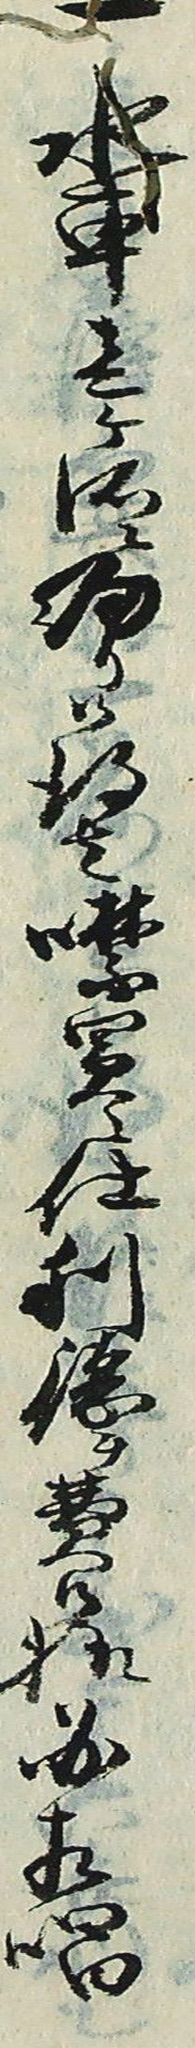一水車壱ケ所に偏り候得者噤買に仕利得を費候様必相唱
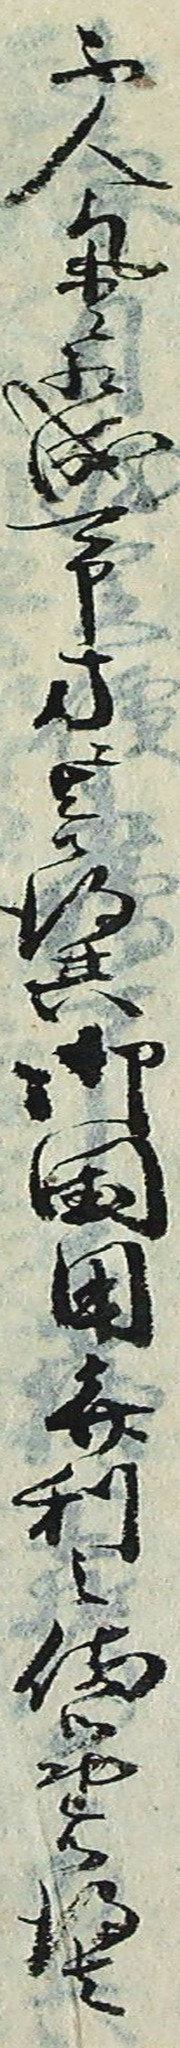不人気に相成可申方に者候得共御国用弁利之備御坐候得者
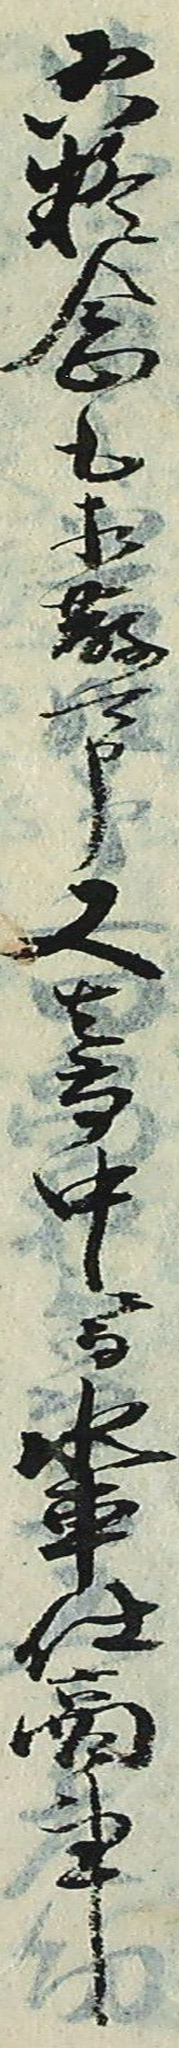右疑念も相散可申又者市中に而水車仕商事
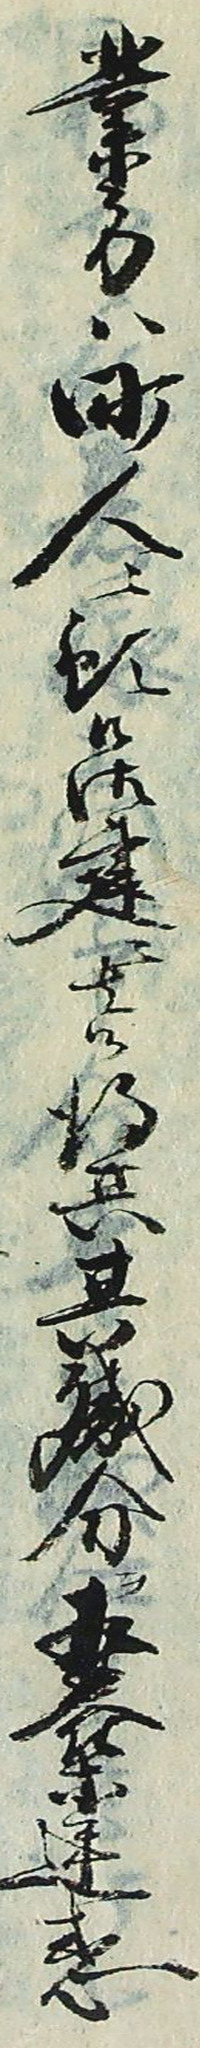業方は町人に預候御建に者候得共其職分を相奪迷惑
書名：油稼御取究ニ附御箇條書テ以被仰渡南北同役申談御答書控
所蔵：鳴門教育大学 Naruto University of Education
